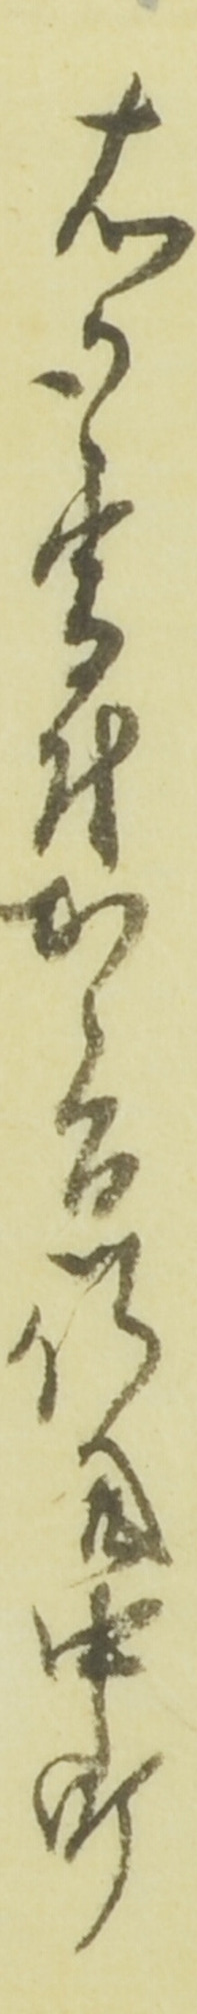右御書付出候間行司中町
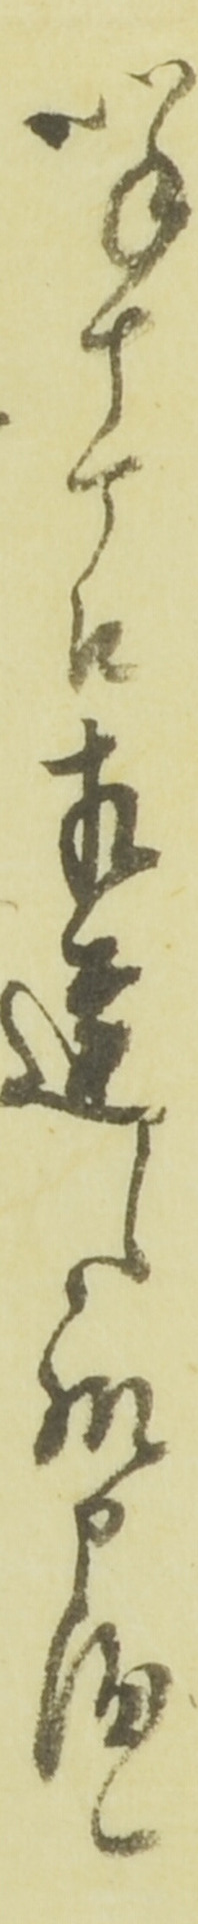呼十丁江相達し候様申渡候
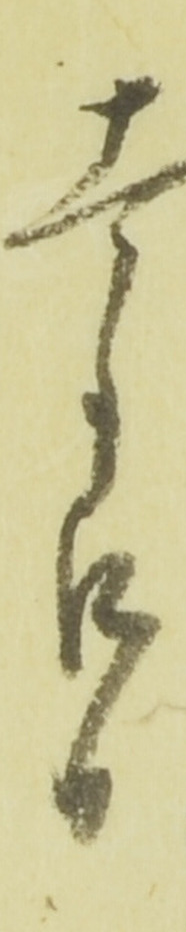十一月四日
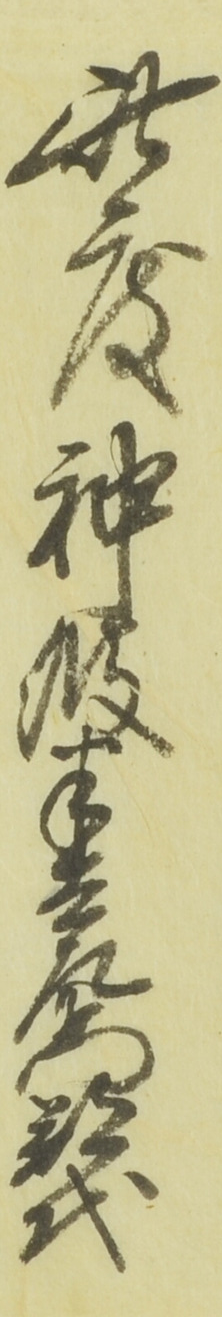此度神波半太左衛門郡代
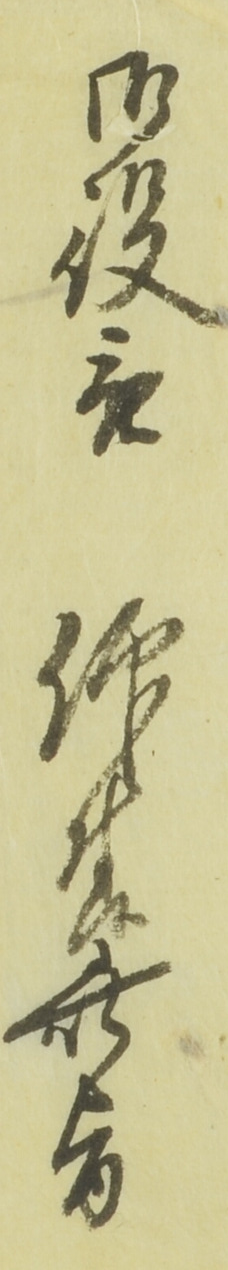御役被仰付候此旨
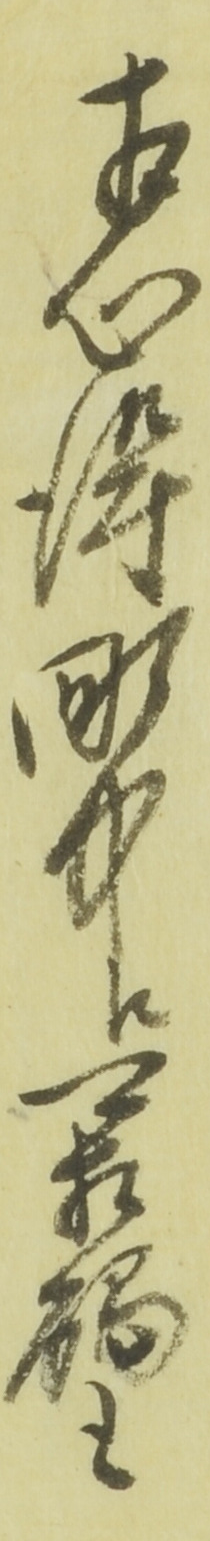相心得町中江可相触も
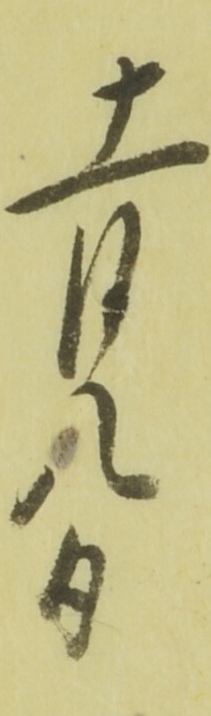十一月八日
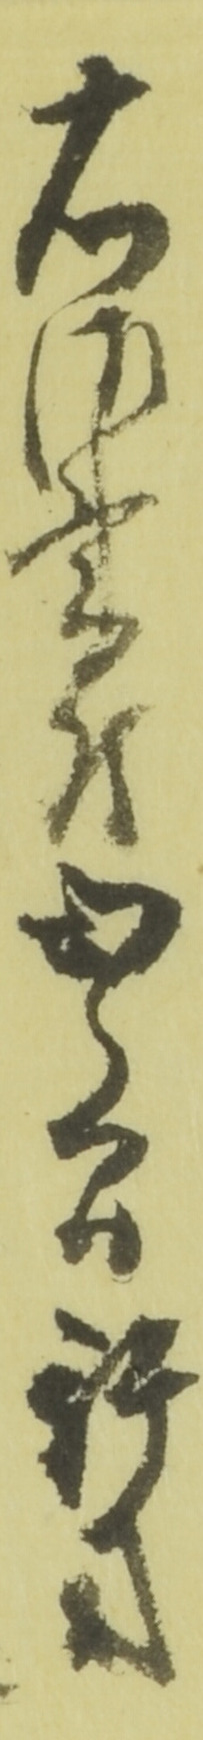右御書付出候間行司
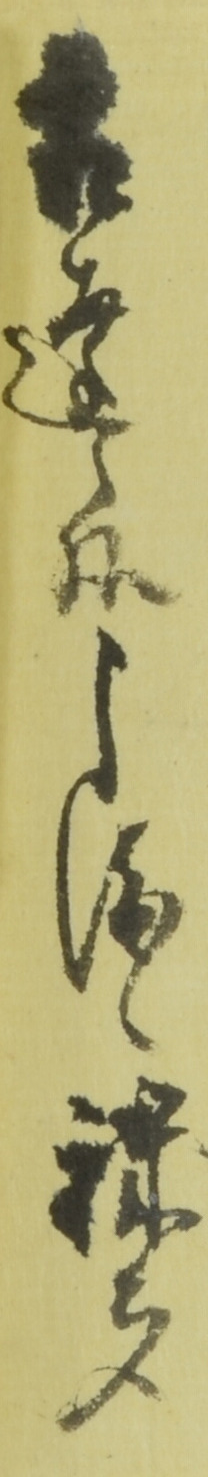相達候様申渡候穢多

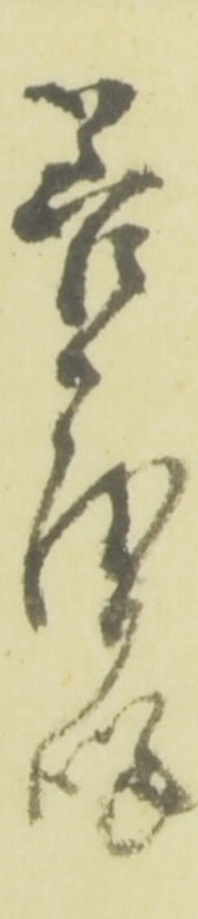善蔵呼
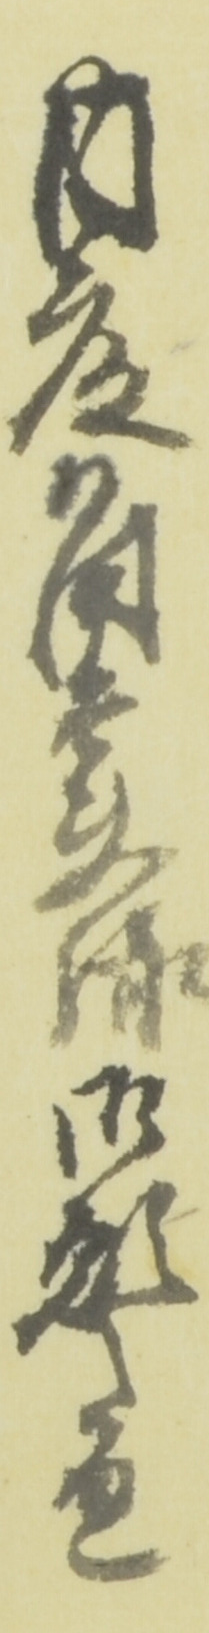内藤角太夫様御願之通
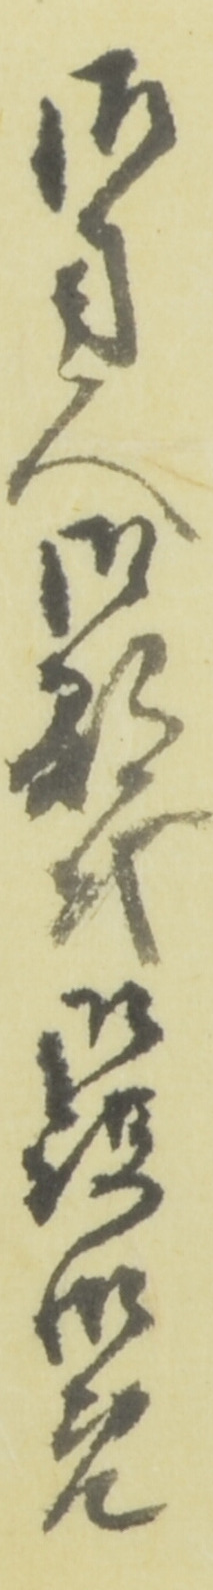御用人御郡代御役御免
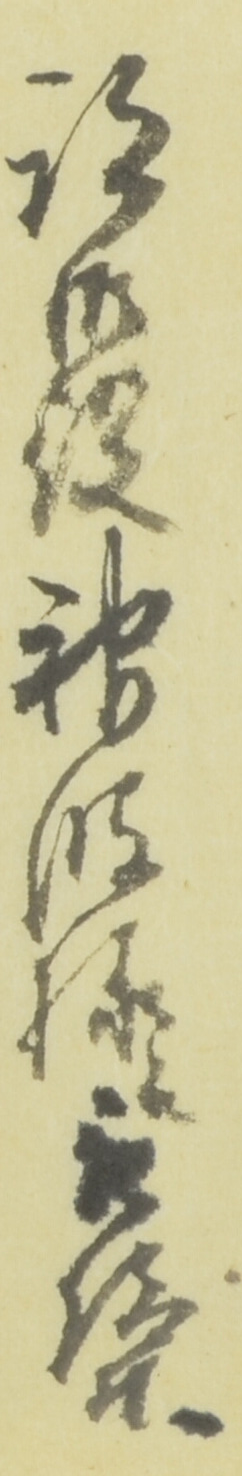跡御役神波様江被仰付
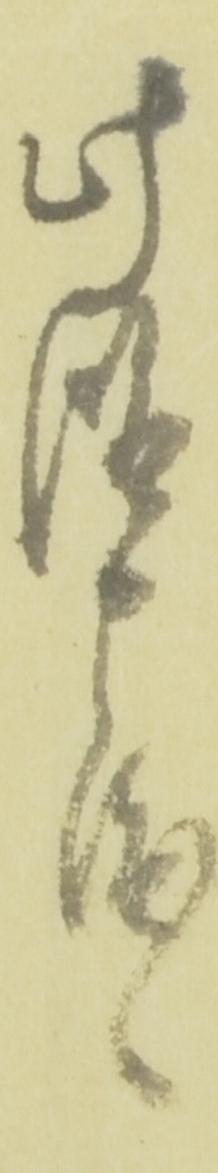此呼申渡候
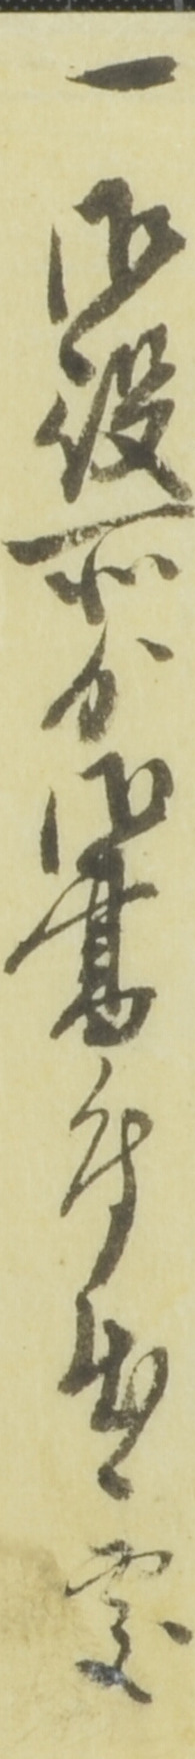一御役所ゟ御書付出候処
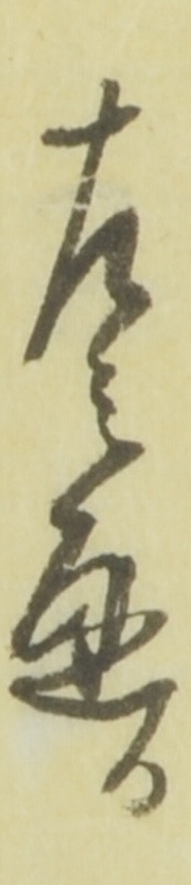左之通り
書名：御触書御書附控
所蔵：伊那市立高遠町図書館・合同会社AMANE
